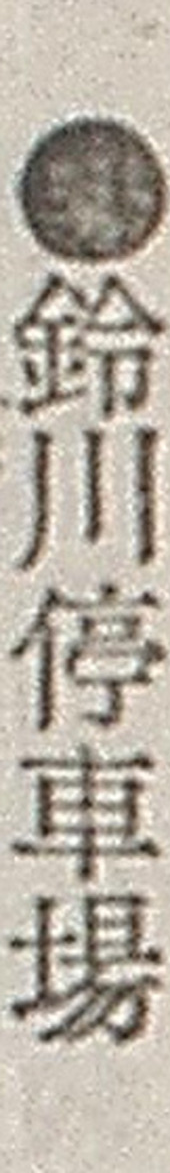●鈴川停車場
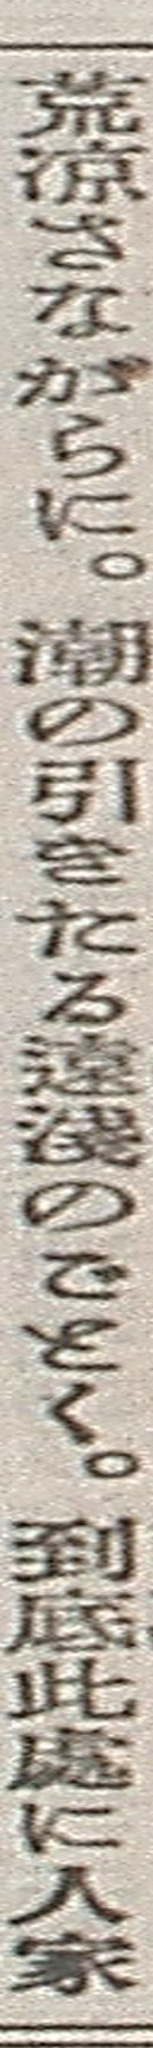荒涼さながらに。潮の引きたる遠浅のごとく。到底此処に人家
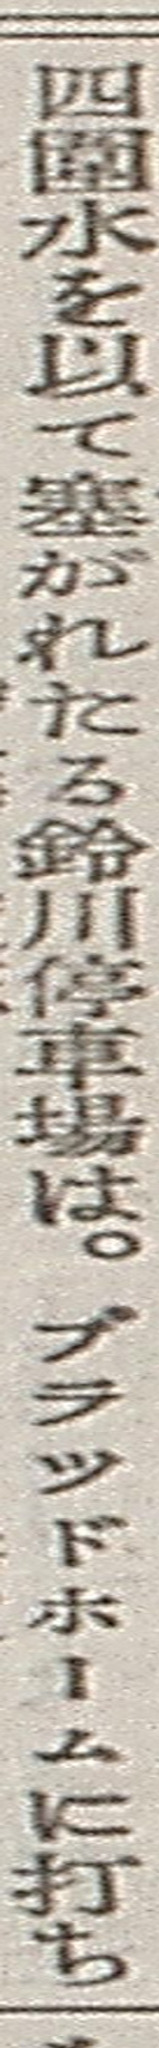四囲水を以て塞がれたる鈴川停車場は。プラツドホームに打ち
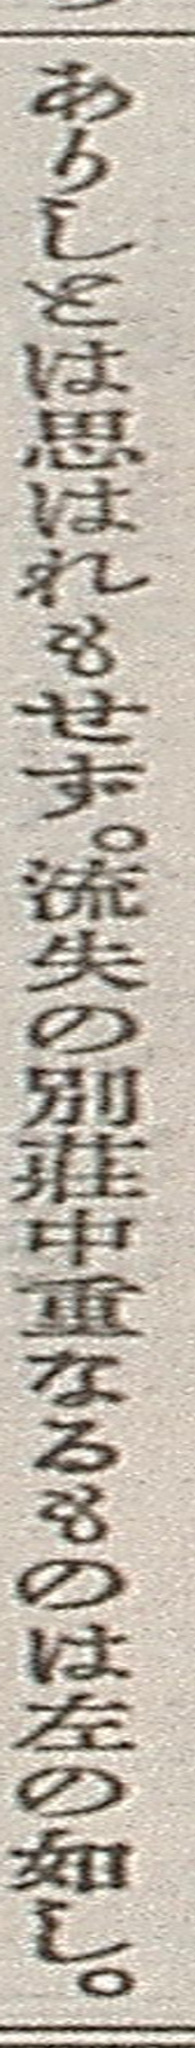ありしとは思はれもせず。流失の別荘中重なるものは左の如し。
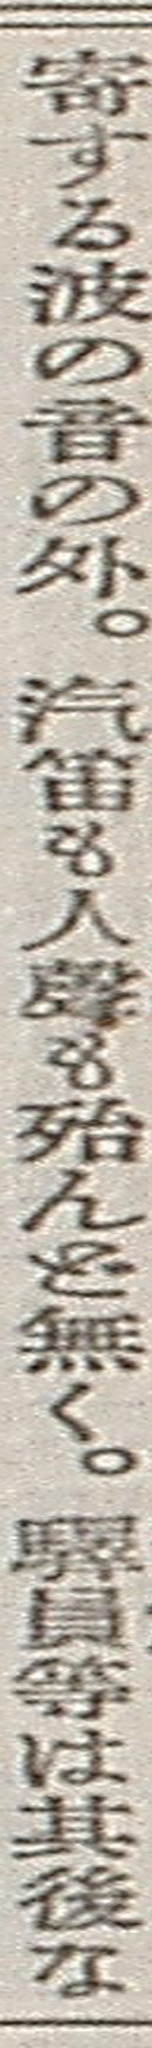寄する波の音の外。汽笛も人声も殆んど無く。駅員等は其後な
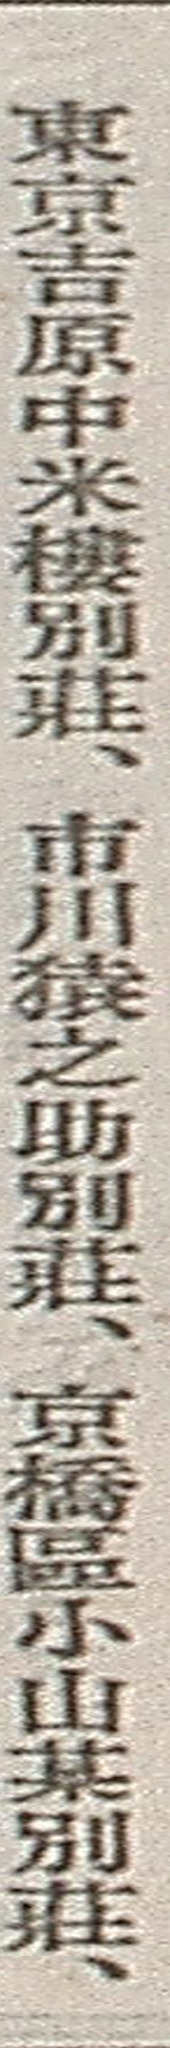東京吉原中米楼別荘、市川猿之助別荘、京橋区小山某別荘、
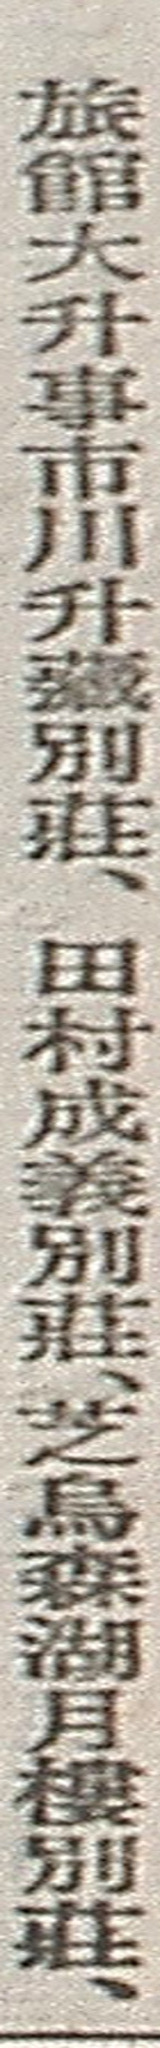旅館大升事市川升蔵別荘、田村成義別荘、芝鳥森湖月楼別荘、
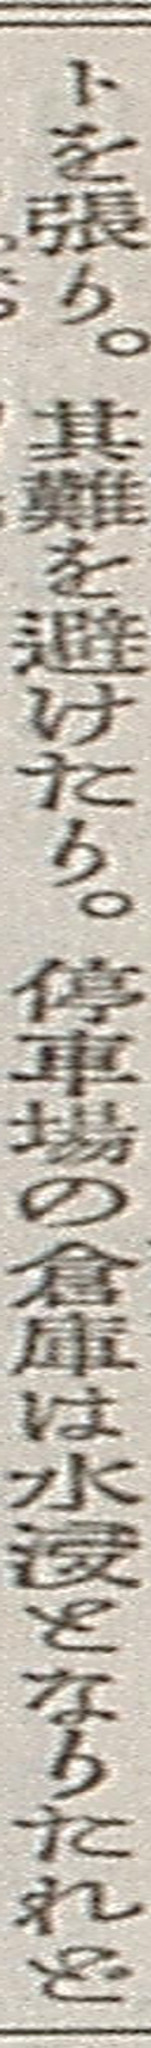トを張り。其難を避けたり。停車場の倉庫は水浸となりたれど
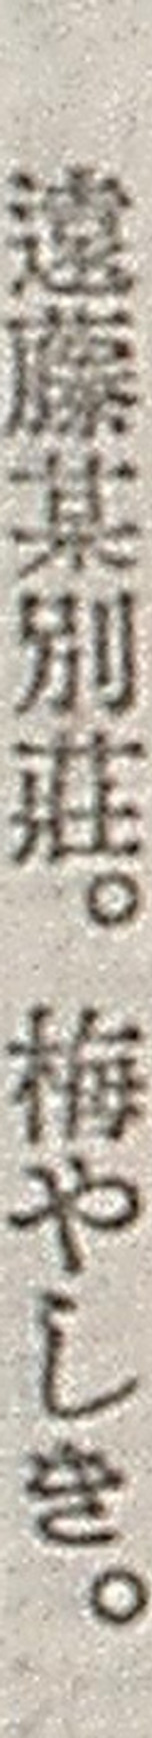遠藤某別荘。梅やしき。
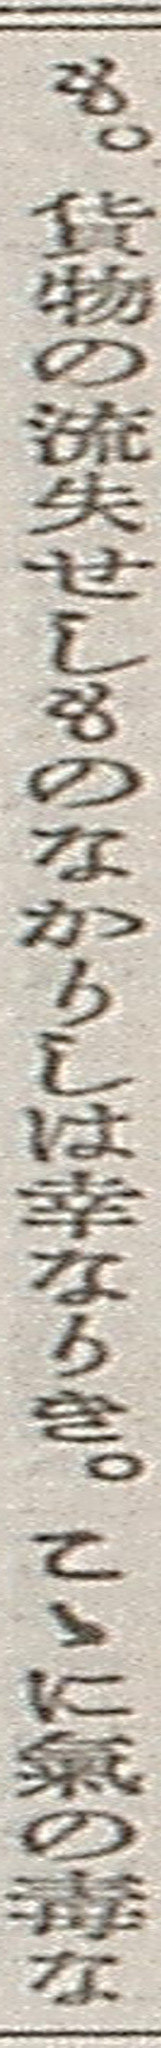も。貨物の流失せしものなかりしは幸なりき。こゝに気の毒な
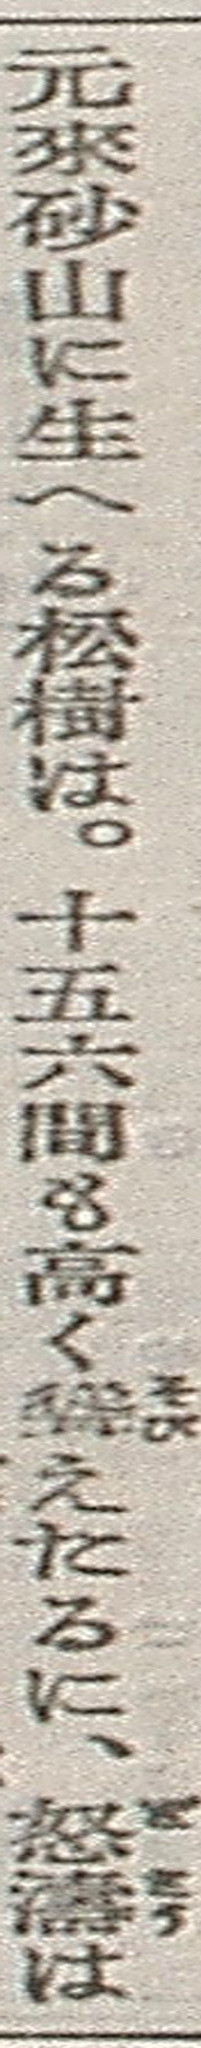元来砂山に生へる松樹は。十五六間も高く聳えたるに、怒濤は
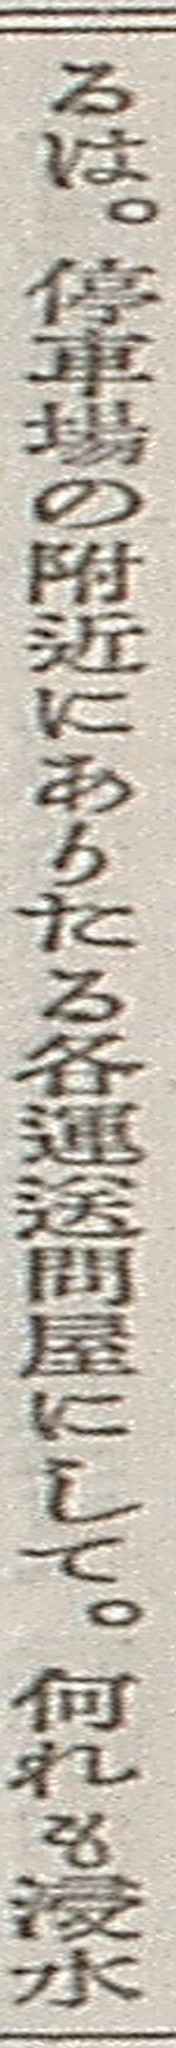るは。停車場の附近にありたる各運送問屋にして。何れも浸水
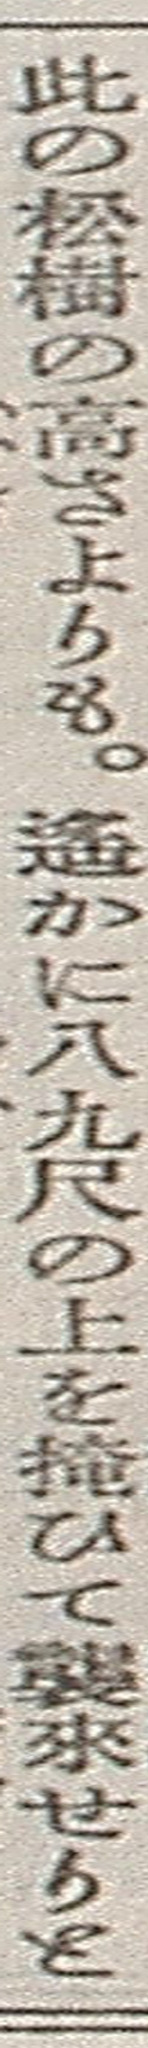此の松樹の高さよりも。遥かに八九尺の上を掩ひて襲来せりと
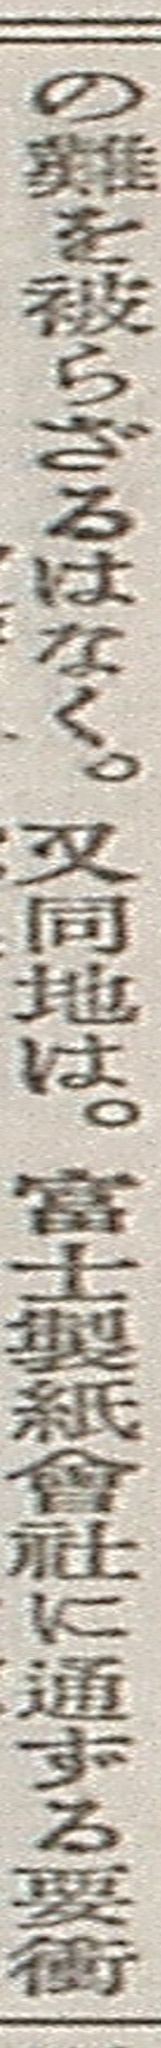の難を被らざるはなく。又同地は。富士製紙会社に通ずる要衝
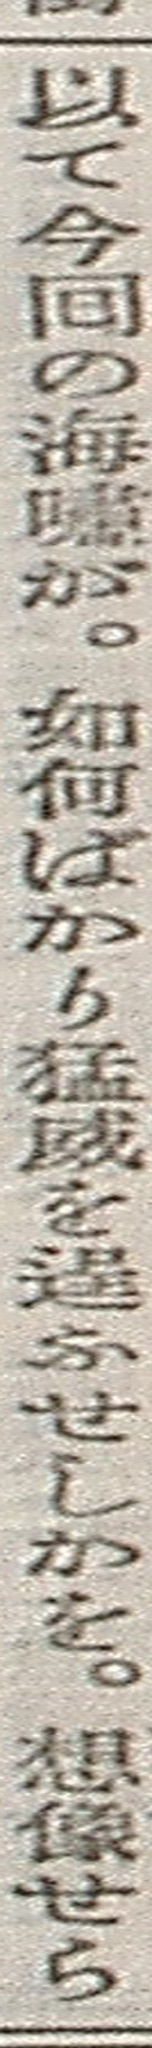以て今回の海嘯が。如何ばかり猛威を逞ふせしかを。想像せら
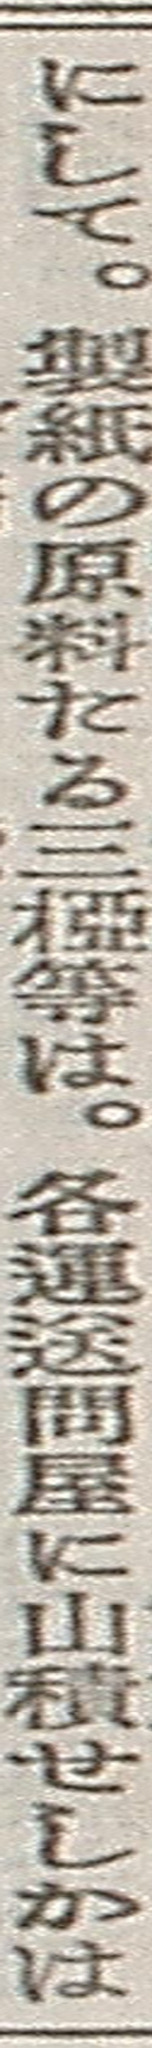にして。製紙の原料たる三椏等は。各運送問屋に山積せしかは
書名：風俗畫報臨時増刊第百九十九號　明治三十二年十月各地災害圖會（前編之續）
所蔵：東京大学地震研究所図書室 Earthquake Research Institute Library, The University of Tokyo, JAPAN
